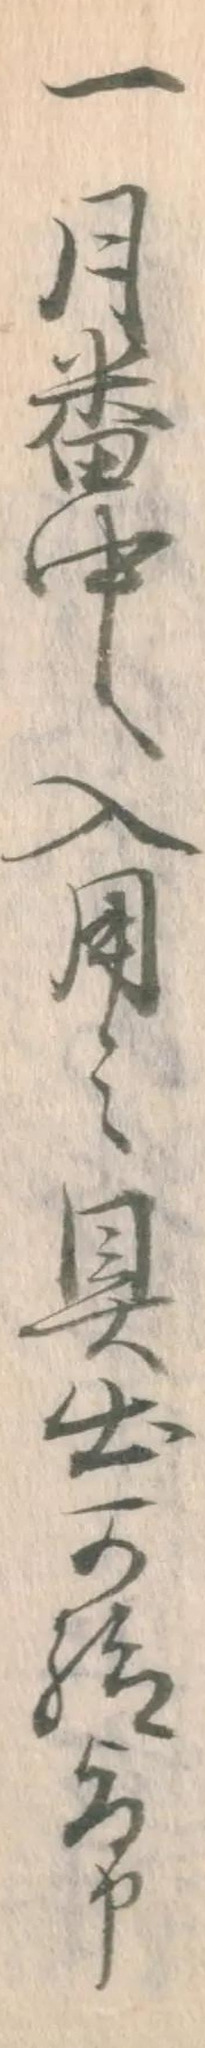一月番中へ入用之具出可給旨申
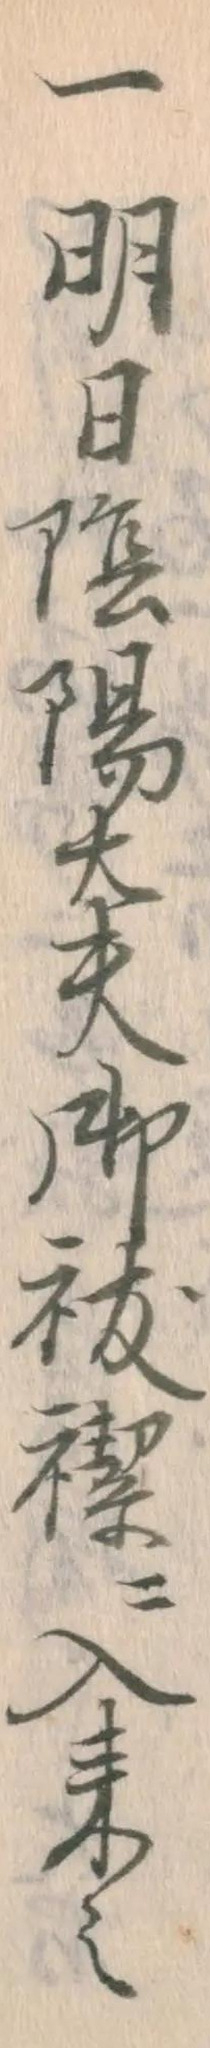一明日陰陽大夫御祓禊に入来之
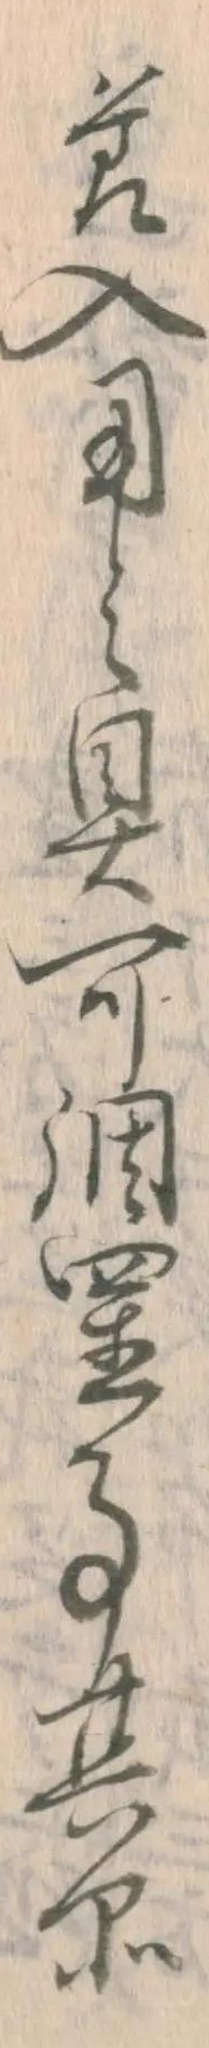節入用之具可調置事其品
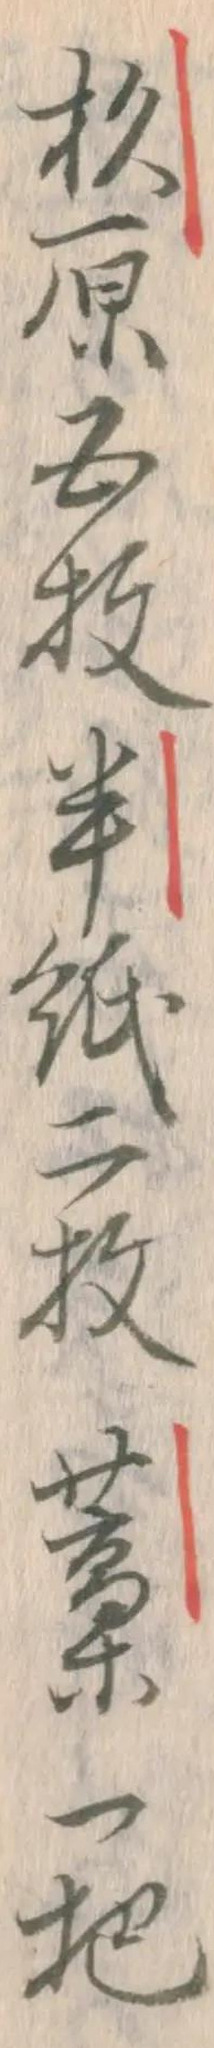杉原五枚半紙二枚藁一把
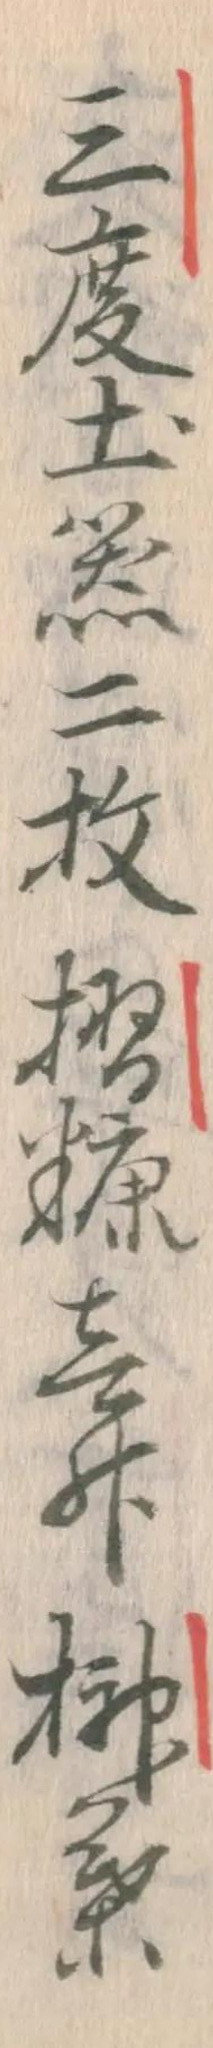三度土器二枚摺糠壱升榊葉
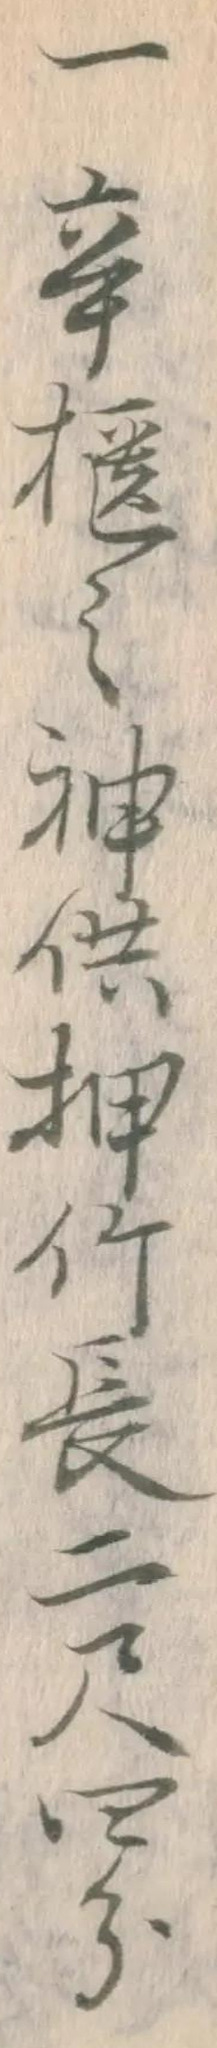一辛櫃之神供押竹長二尺四分
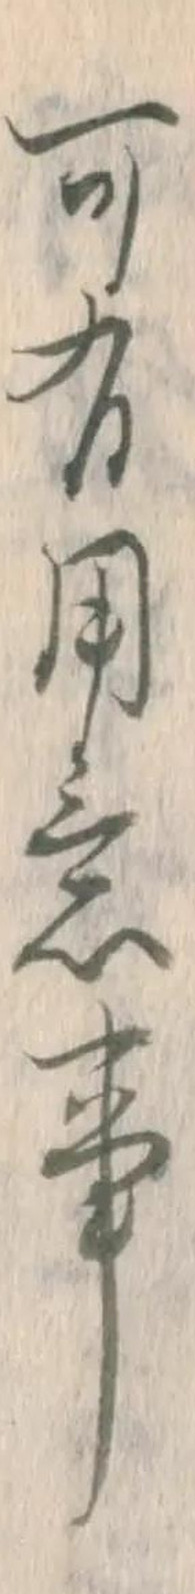可有用意事
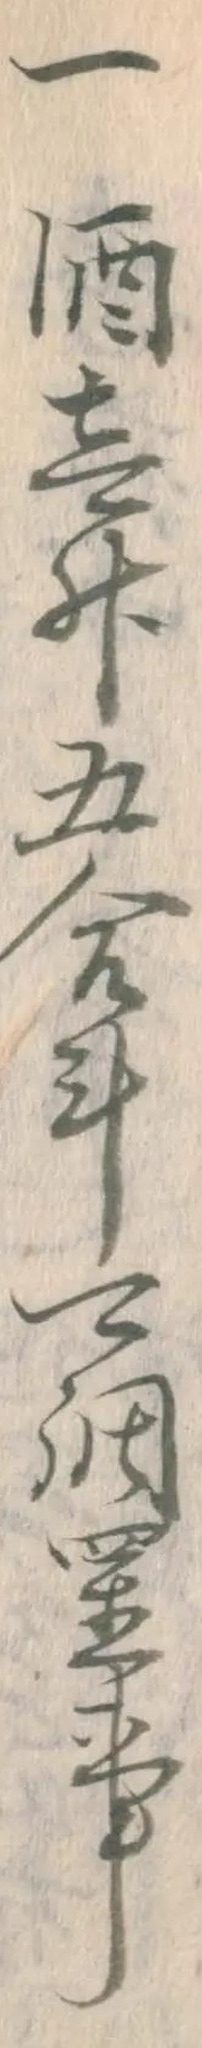一酒壱升五合斗可調置事

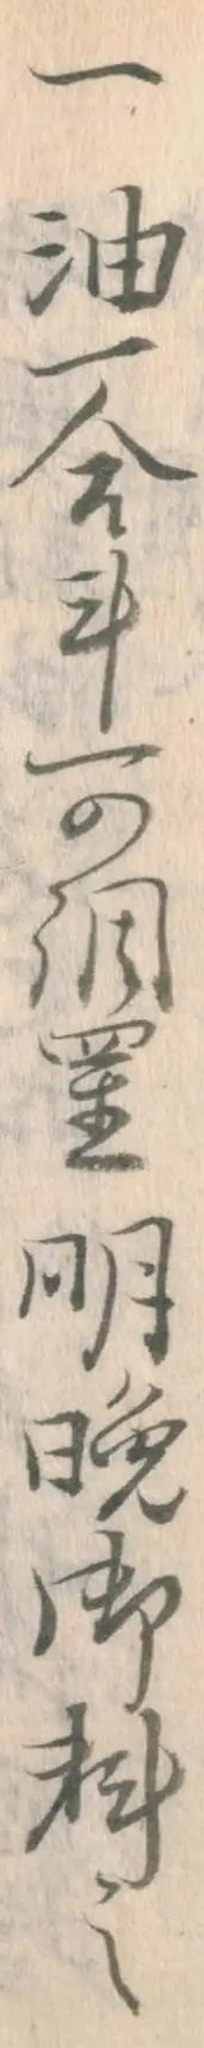一油一合斗可調置明晩御料之
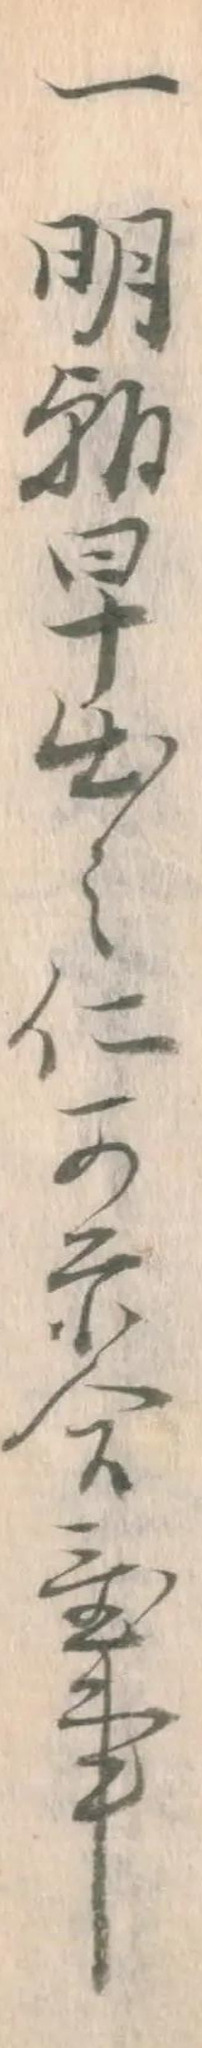一明朝早出之仁可示合置事
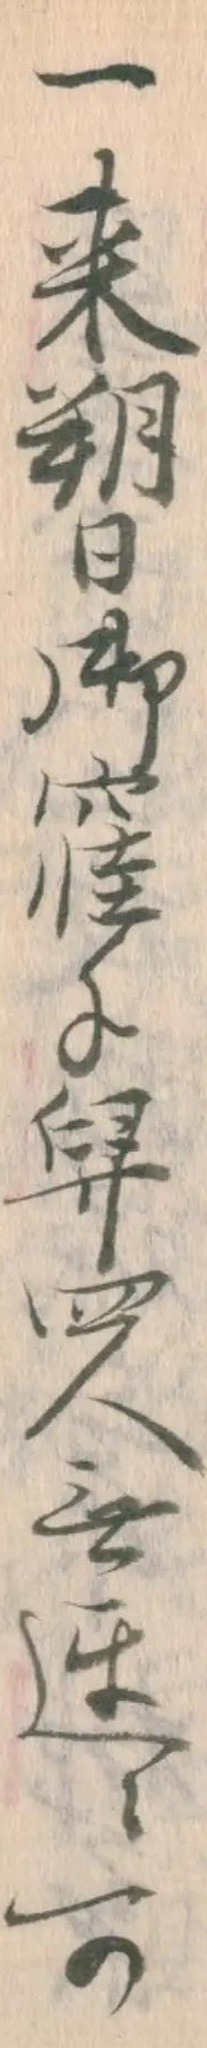一来朔日御窪手舁四人無遅々可
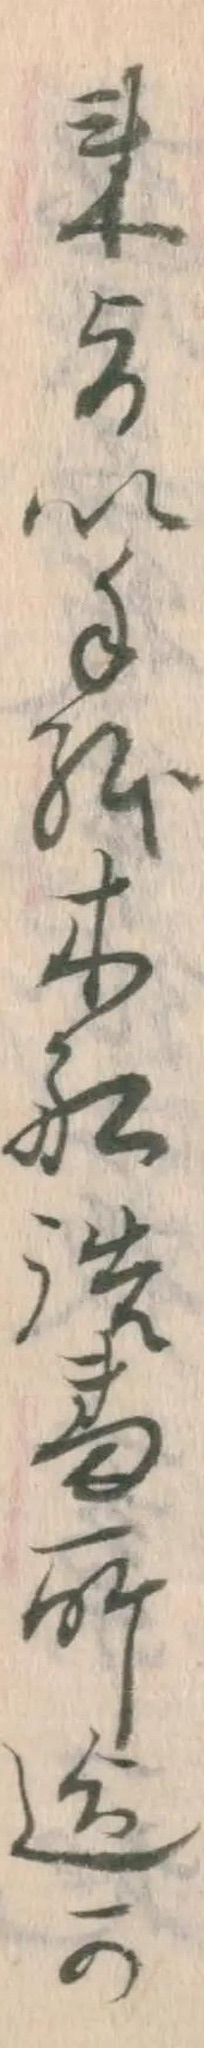来旨以手紙木船詰番所迄可
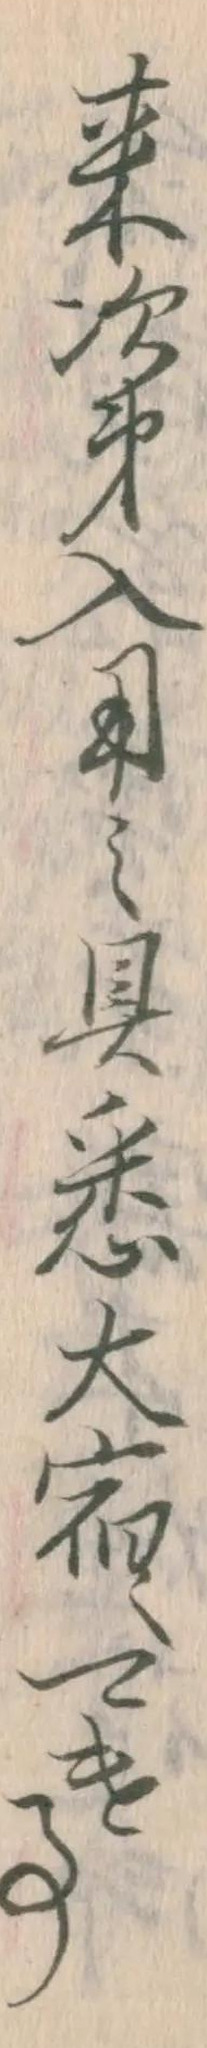来次第入用之具悉大宿へ可遣事
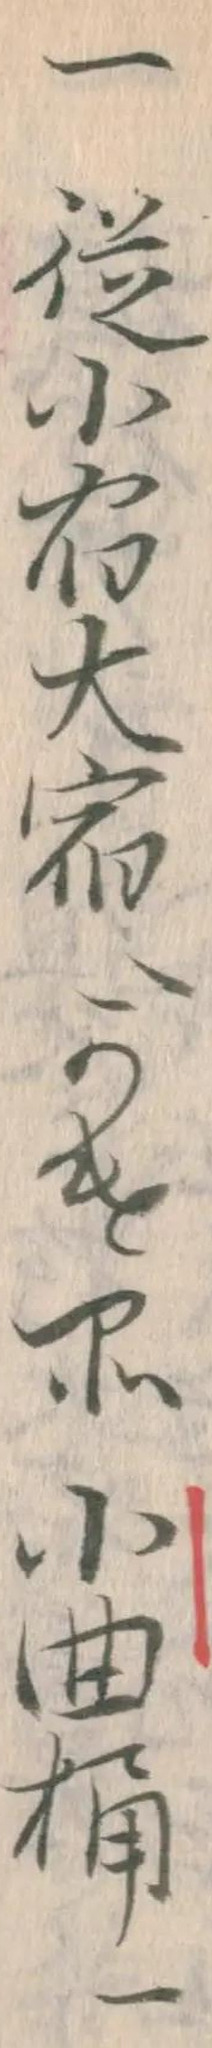一従小宿大宿へ可遣品小曲桶一

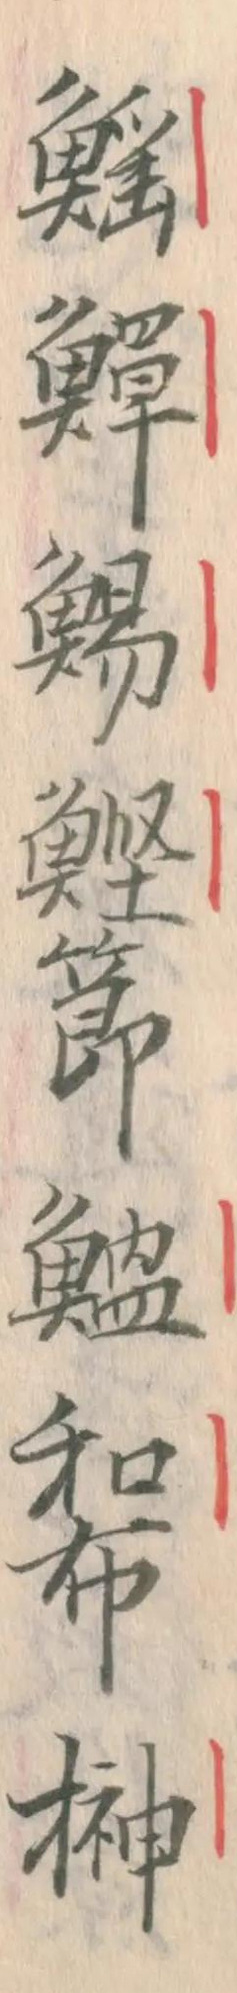鰩鱓鯣鰹節鰛和布榊
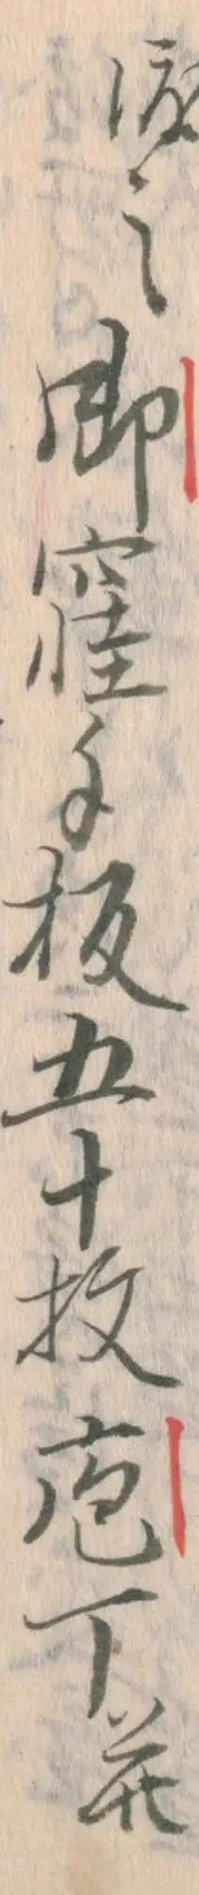渡之御窪手板五十枚包丁并
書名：賀茂社記録. 第81冊
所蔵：国立国会図書館 National Diet Library, JAPAN
